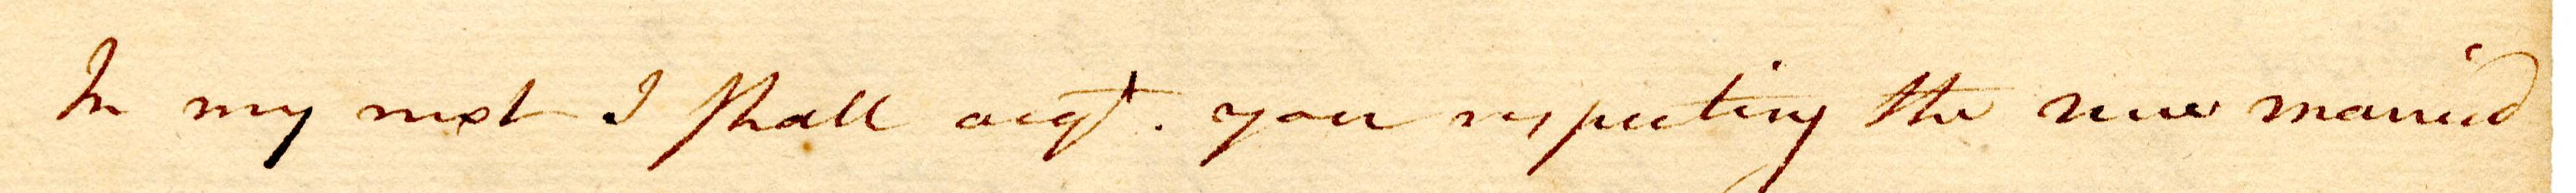In my next I shall acq^t. you respecting the new married
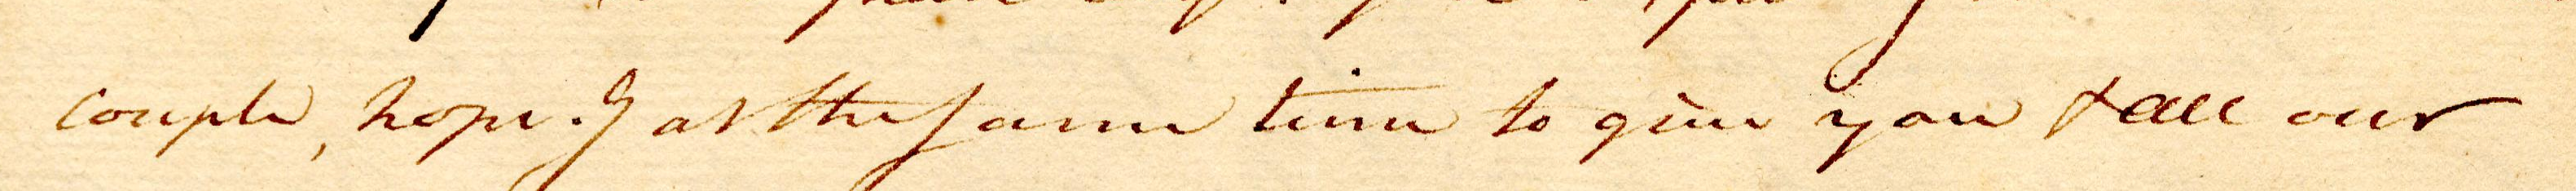Couple, hope^g. at the same time to give you & all our
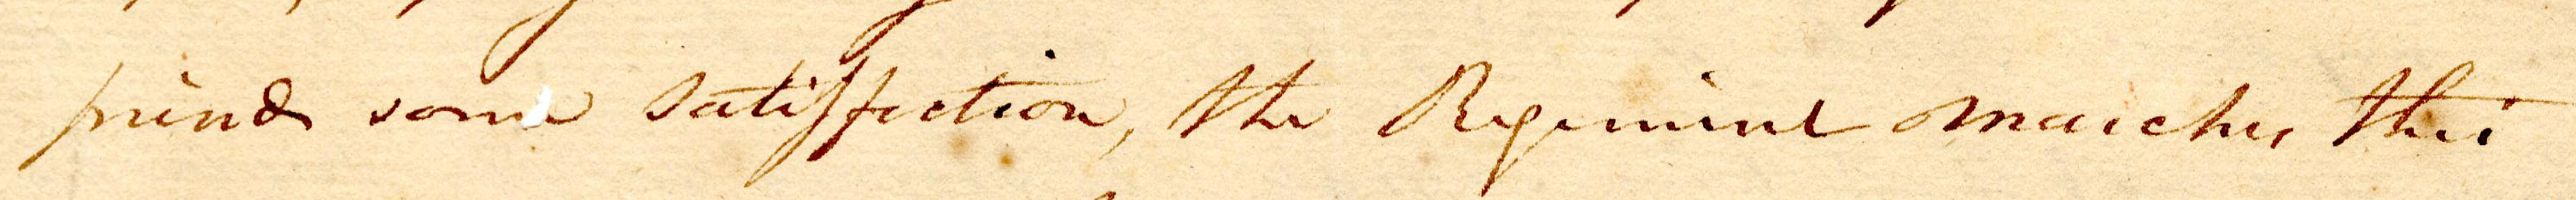frind some satisfaction, the Regiment marches this
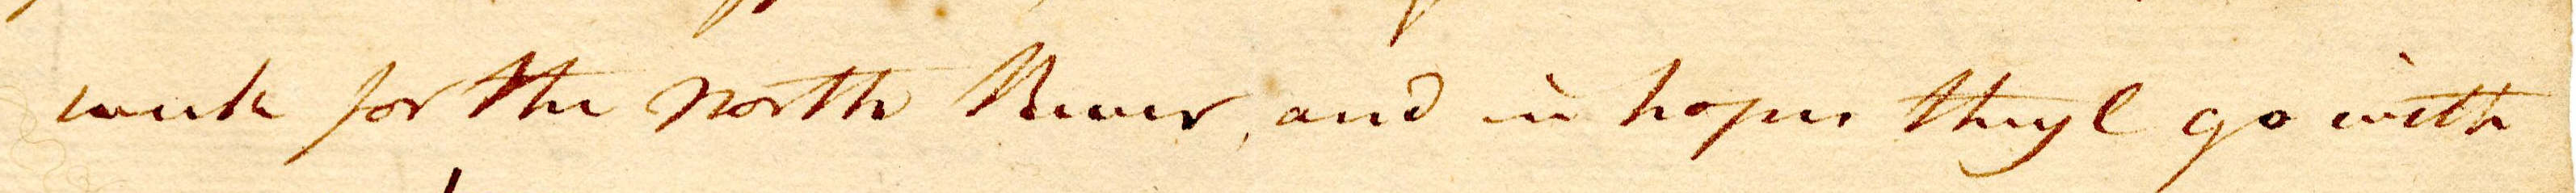week for the North River, and in hopes theyl go with
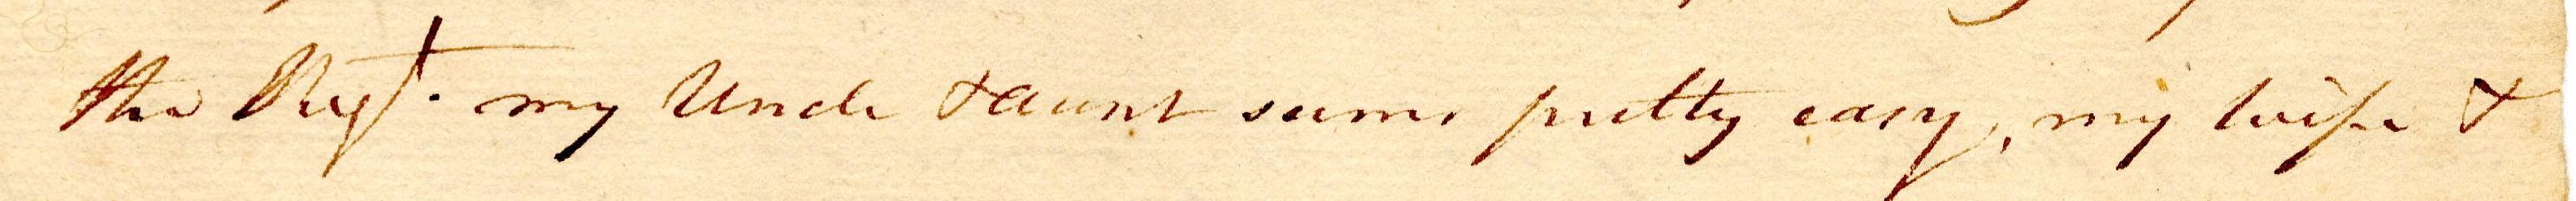the Reg^t. my Uncle & aunt seems pretty easy, my wife &
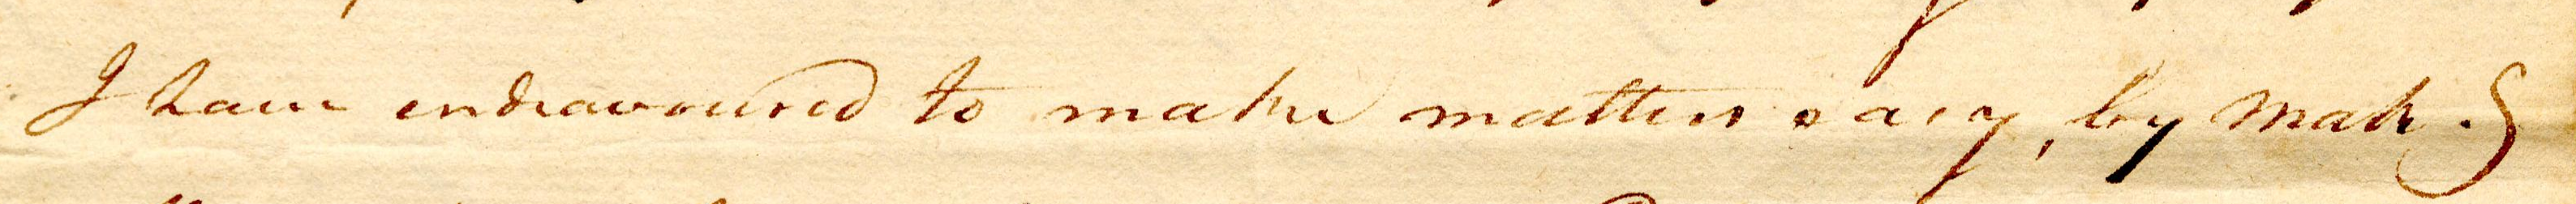I have endeavoured to make matter easy, by mak.g
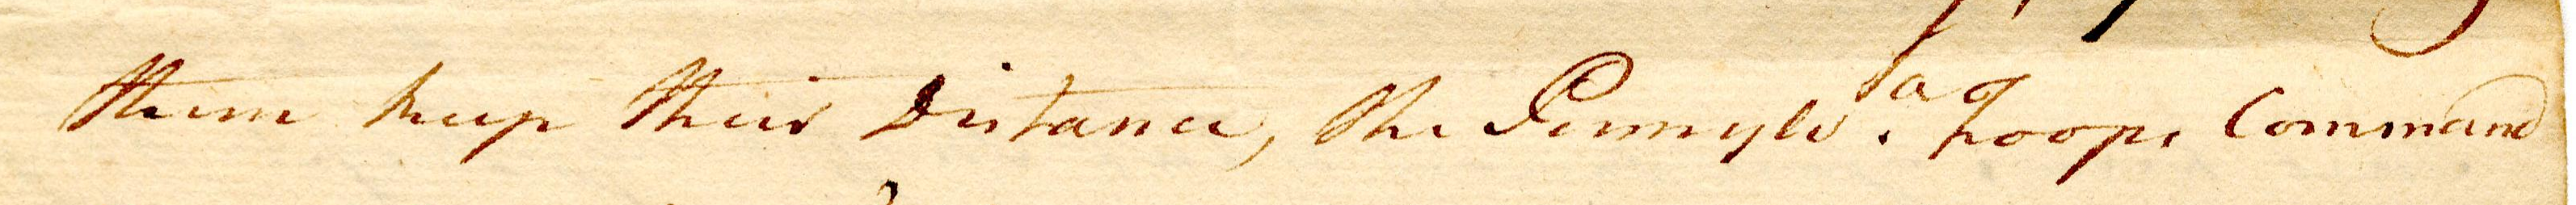them keep their Distance, the Pennsylv^a. Troops Command-
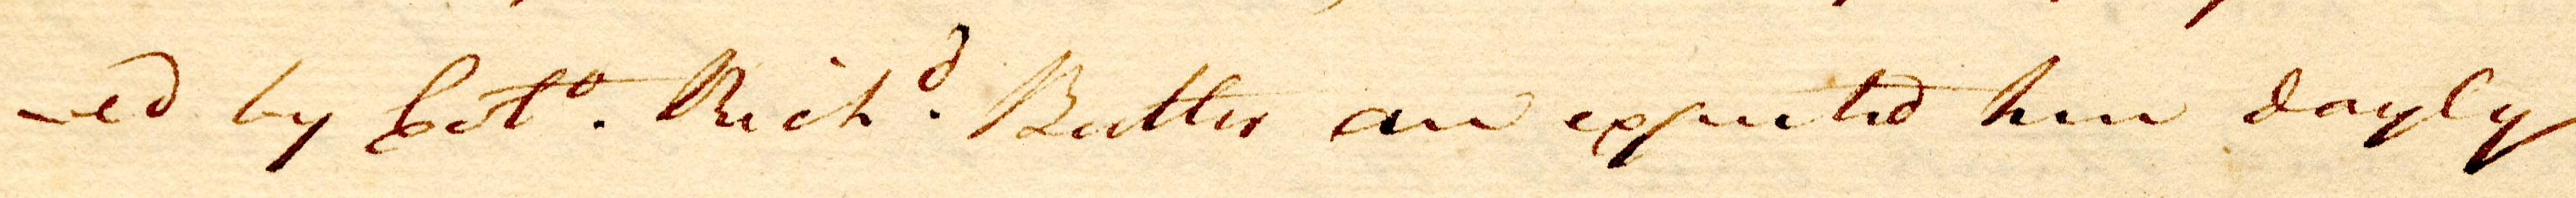-ed by Col^o. Rich^d. Butler are expected here dayly
